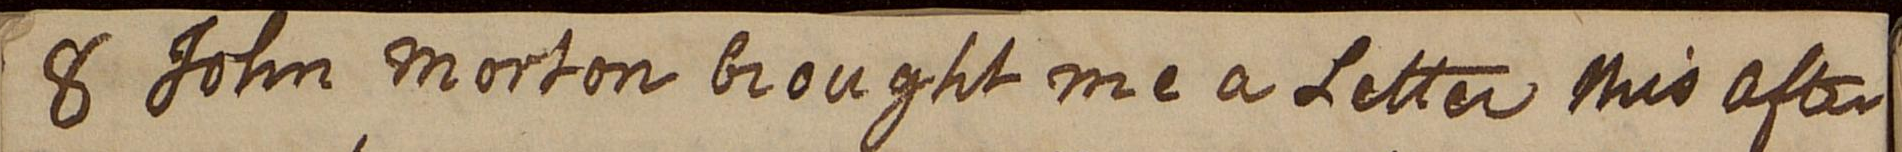8 John Morton brought me a Letter this After
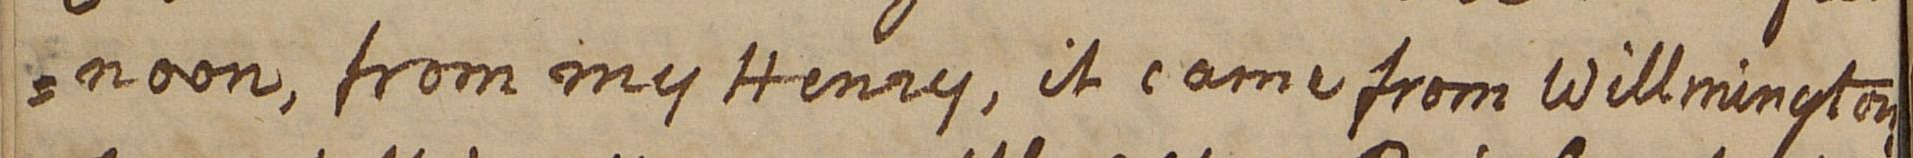-noon, from my Henry, it came from Willmington
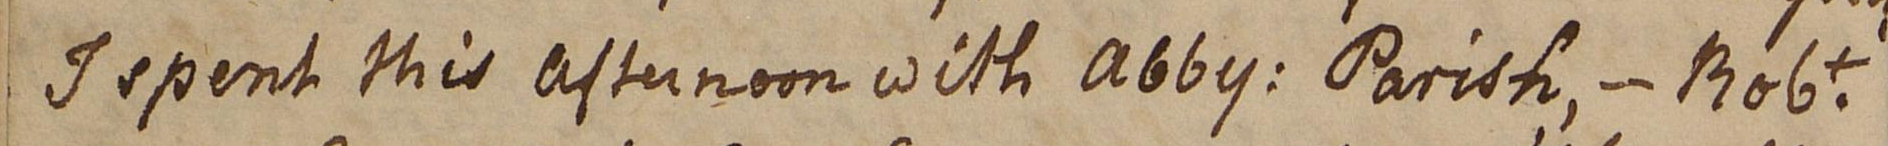I spent this Afternoon with Abby: Parish,- Rob^t.
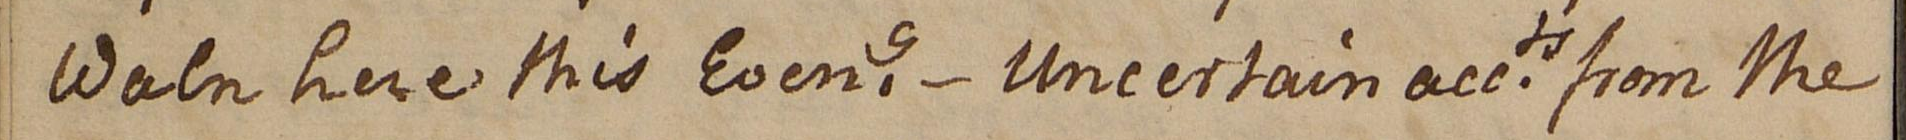Waln here this Even^g.- Uncertain acc^ts. from the
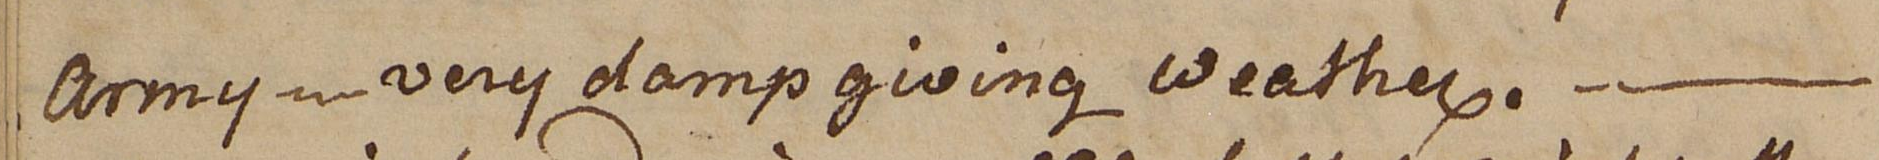Army- very damp giving weather.-
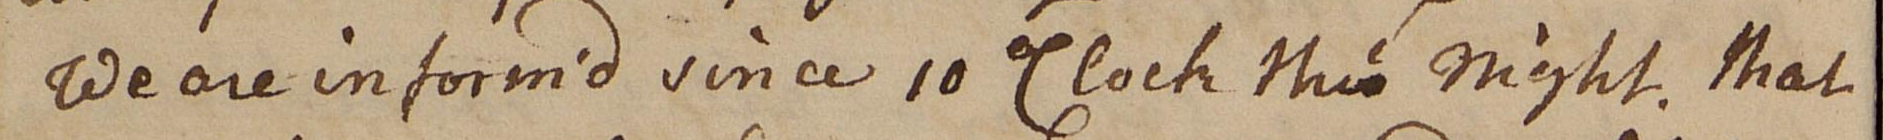We are inform'd since 10 ^oClock this Night, that
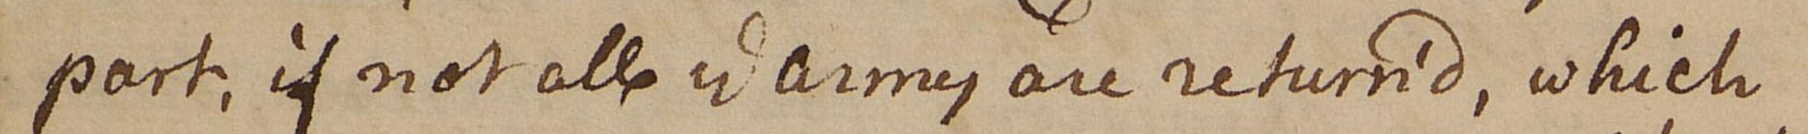part, if not all y^e army are return'd, which
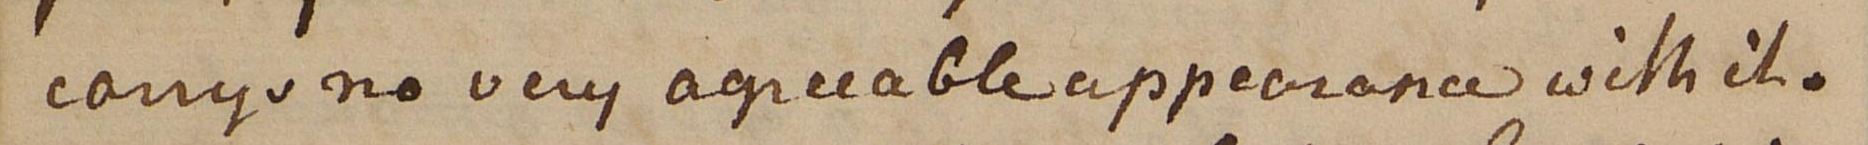carrys no very agreeable appearance with it.
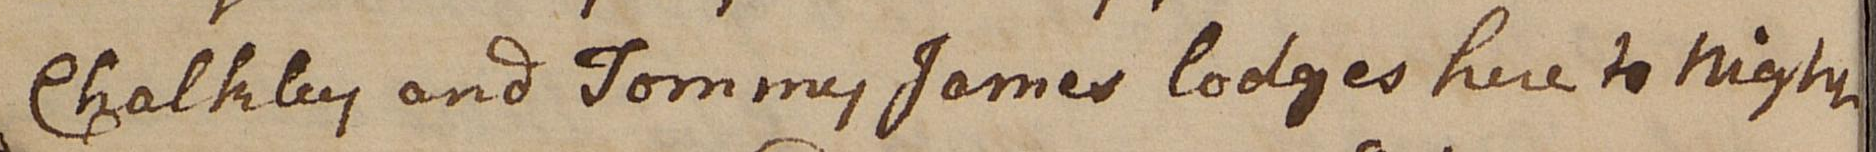Chalkley and Tommy James lodges here to Night
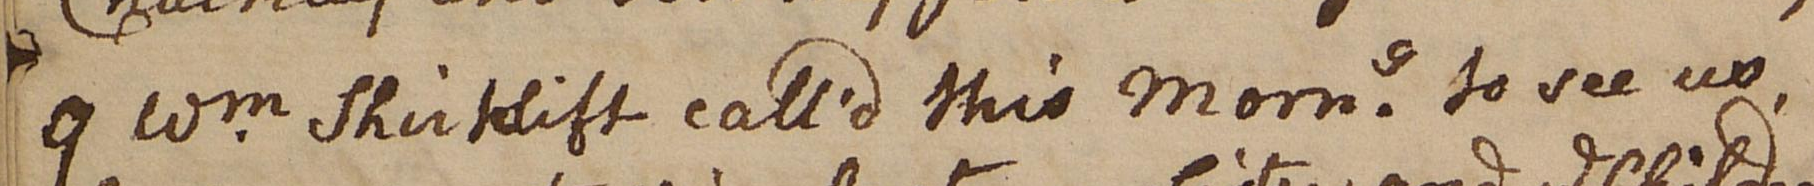9 W^m. Shirklift call'd this Morn^g. to see us,
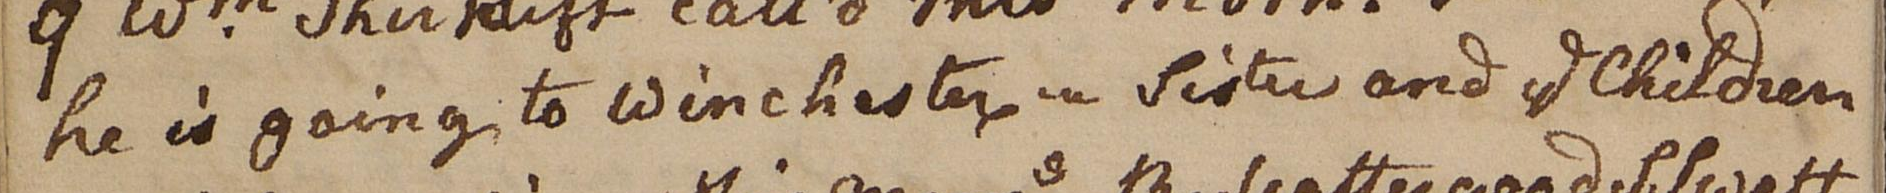he is going to Winchester - Sister and y^e Children
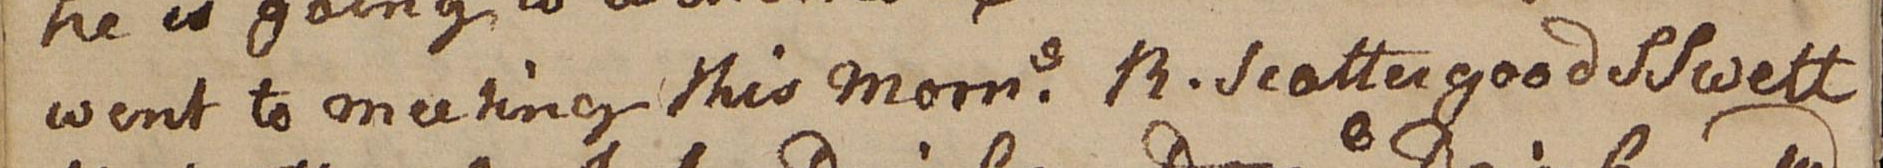went to meeting this morn^g. R. Scattergood S Swett
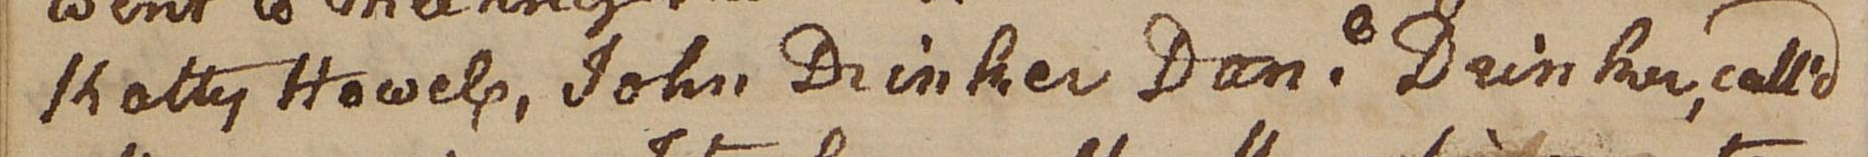Katty Howel, John Drinker Dan^l. Drinker, call'd
